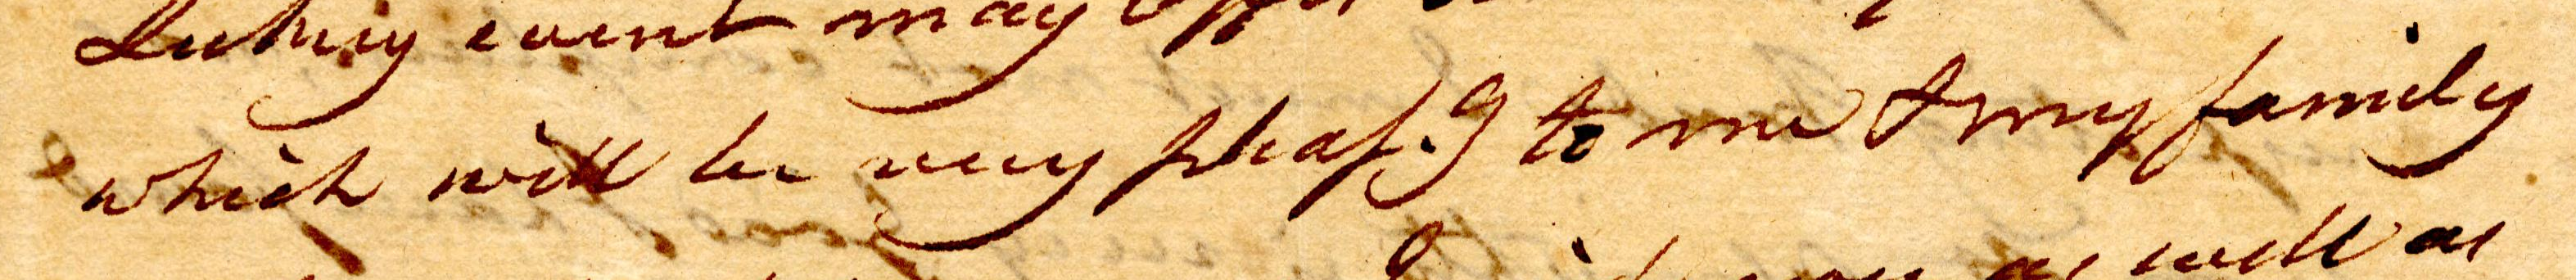which will be very pleas^g. to me & my family
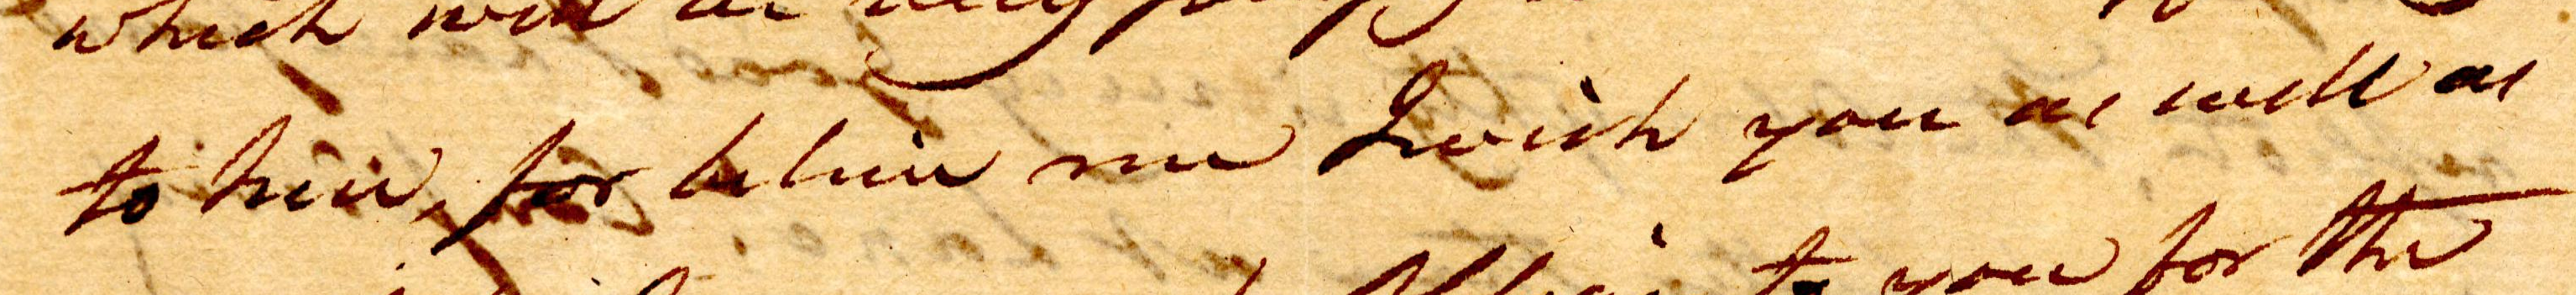to here for believe me I wish you as well as
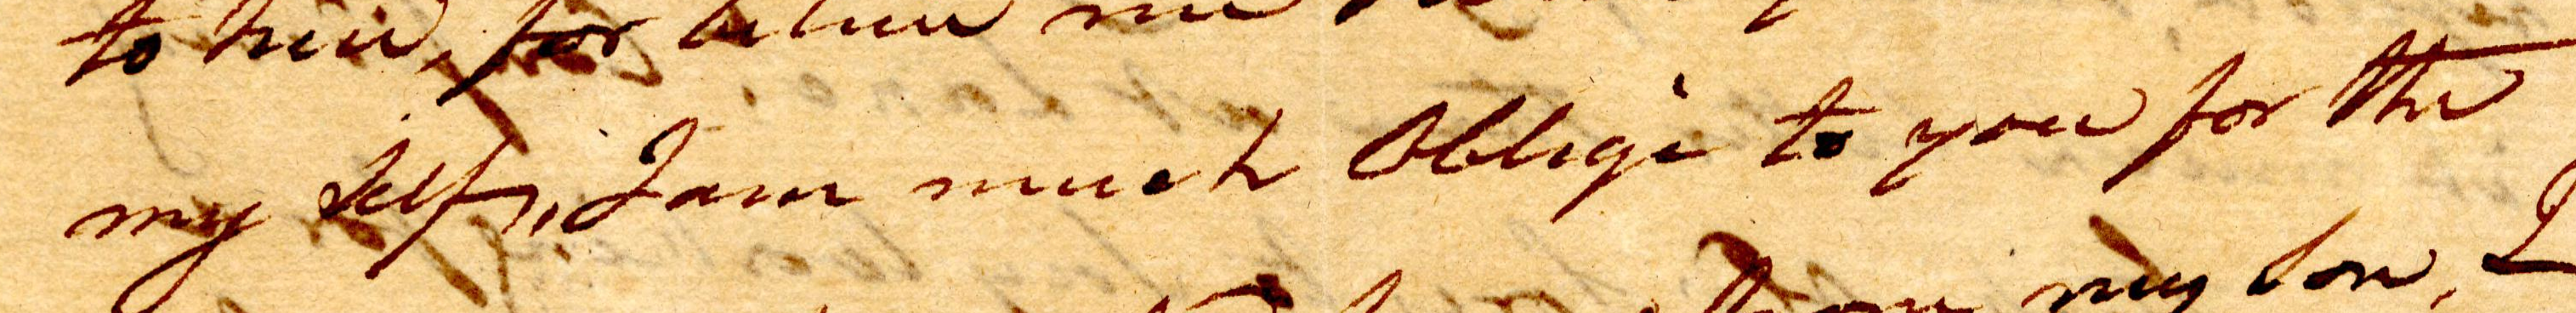my Self I am much oblige to you for the
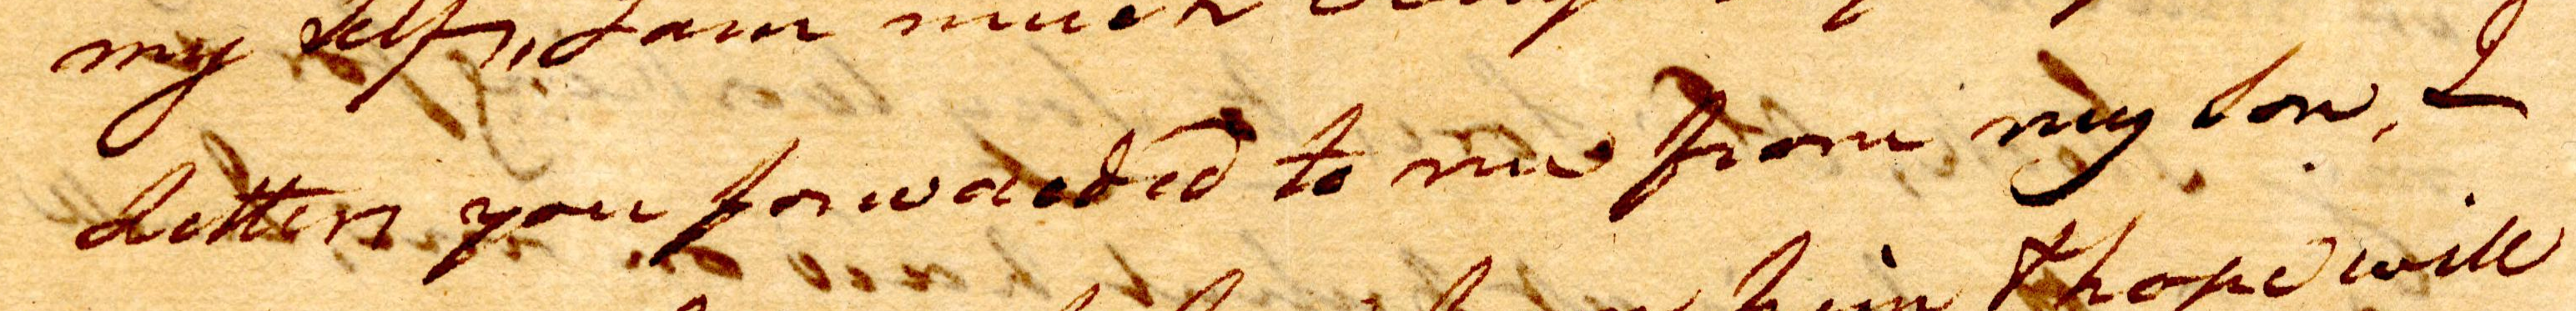Letters you forwarded to me from my son, I
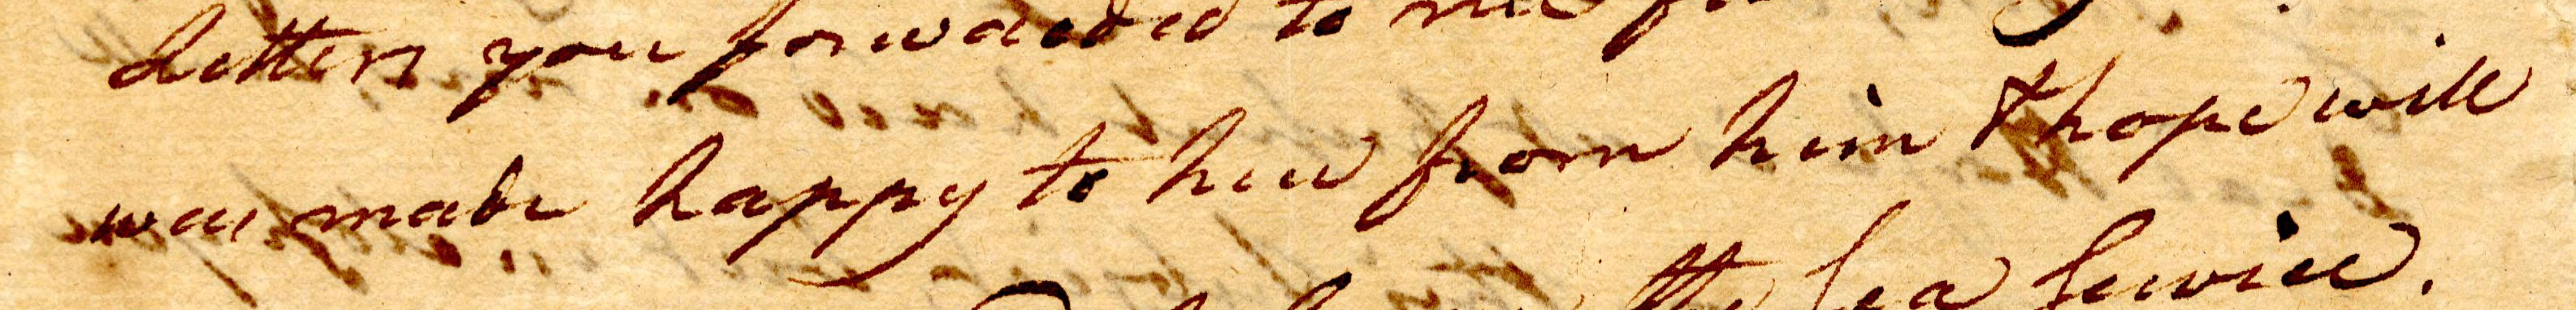was made happy to here from him & hope will
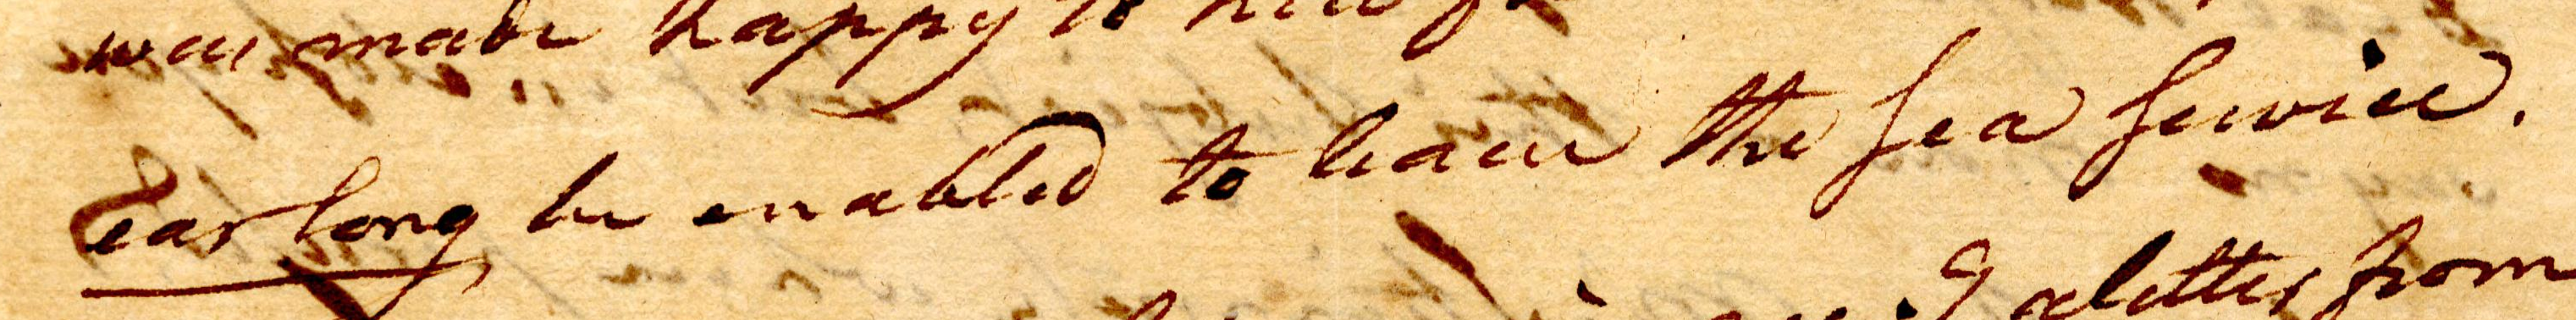ear long, be enabled to leave the sea service.
